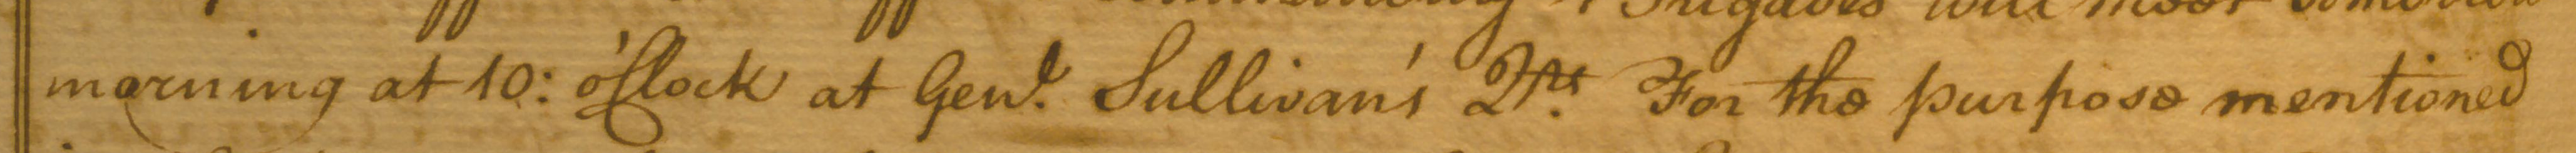morning at 10: o'Clock at Gen^l. Sullivan's Q^rs. For the purpose mentioned
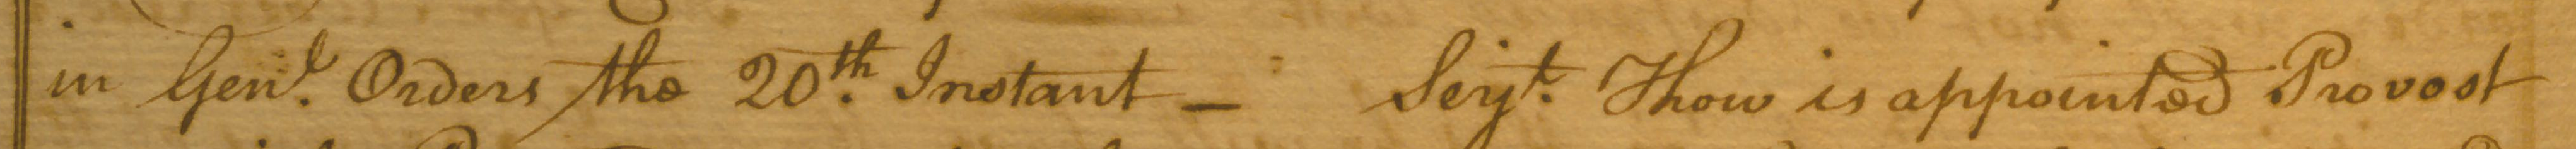in Gen^l. Orders the 20^th. Instant- Serj^t. How is appointed Provost
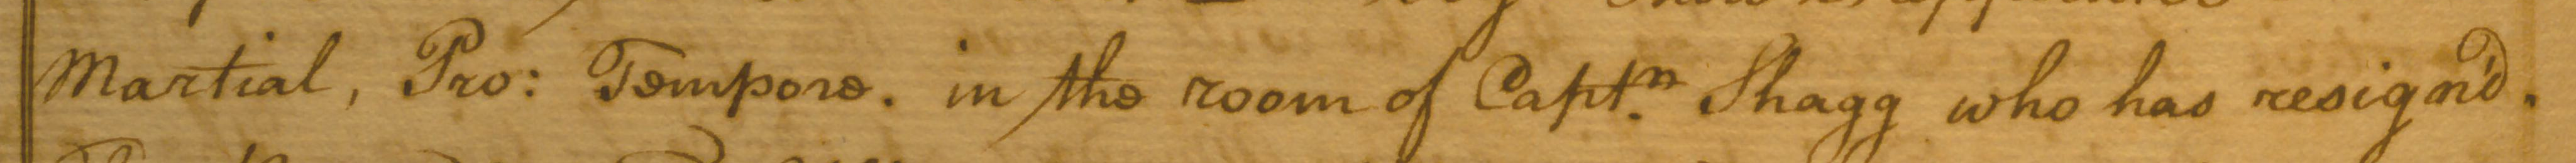Martial, Pro: Tempore. in the room of Capt^n. Shagg who has resign'd.
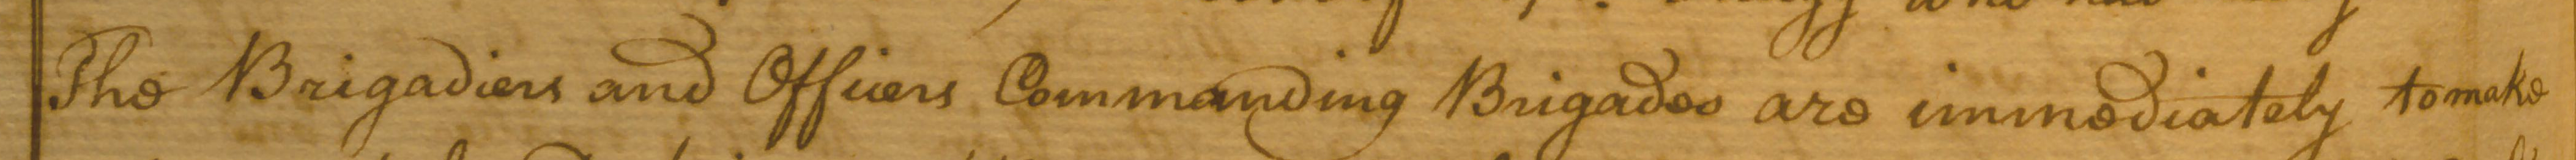The Brigadiers and Officers Commanding Brigades are immediately to make
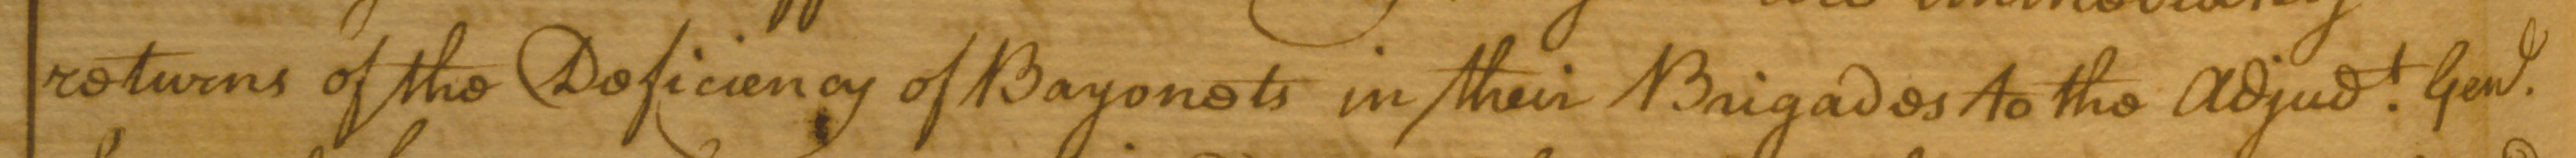returns of the Deficiency of Bayonets in their Brigades to the Adjud^t. Gen^l.
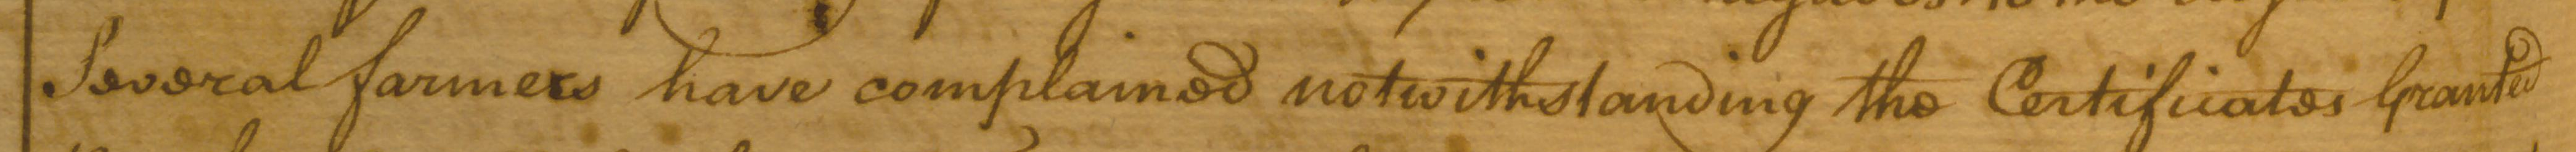Several farmers have complained notwithstanding the Certificates Granted
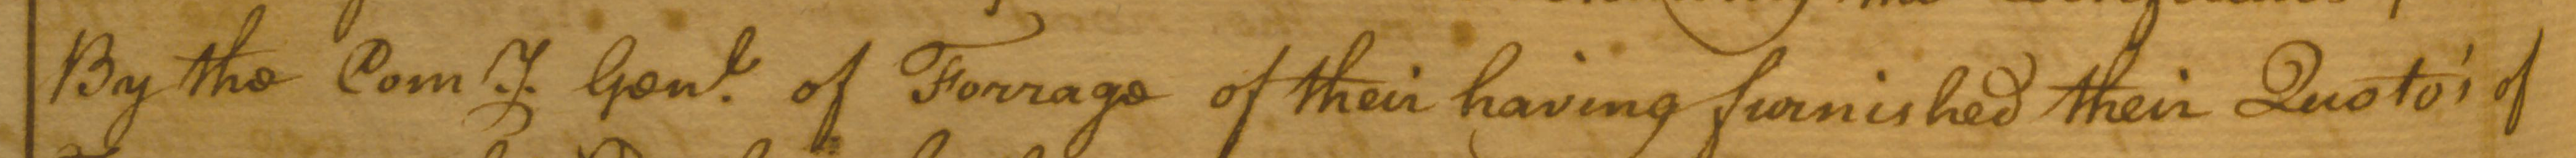By the Com^y. Gen^l. of Forrage of their having furnished their Quoto's of
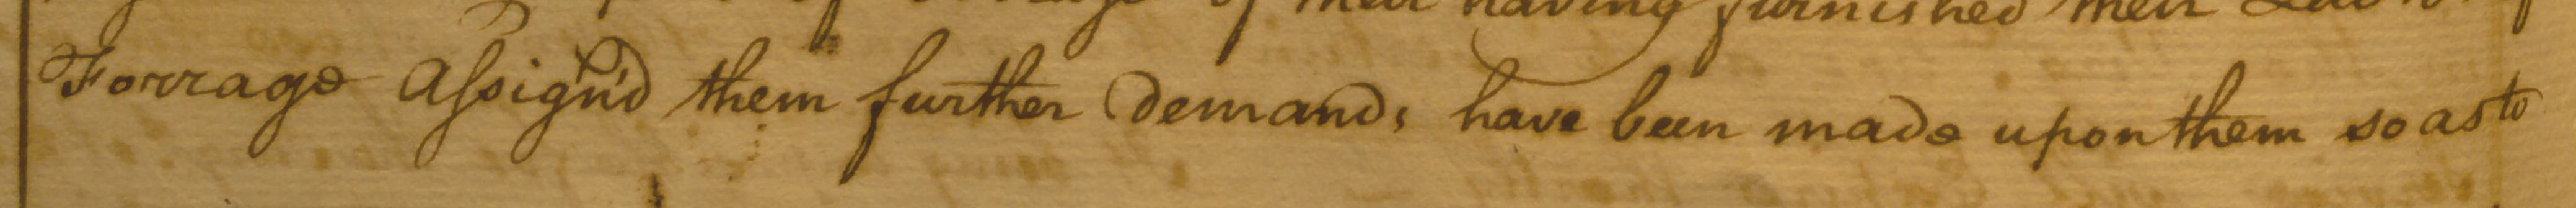Forrage Assign'd them further demands have been made upon them so as to
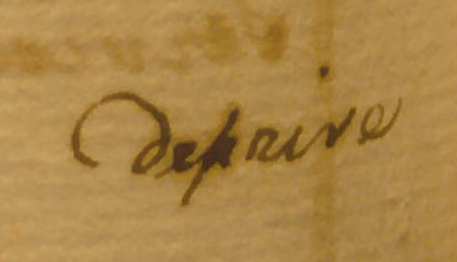deprive
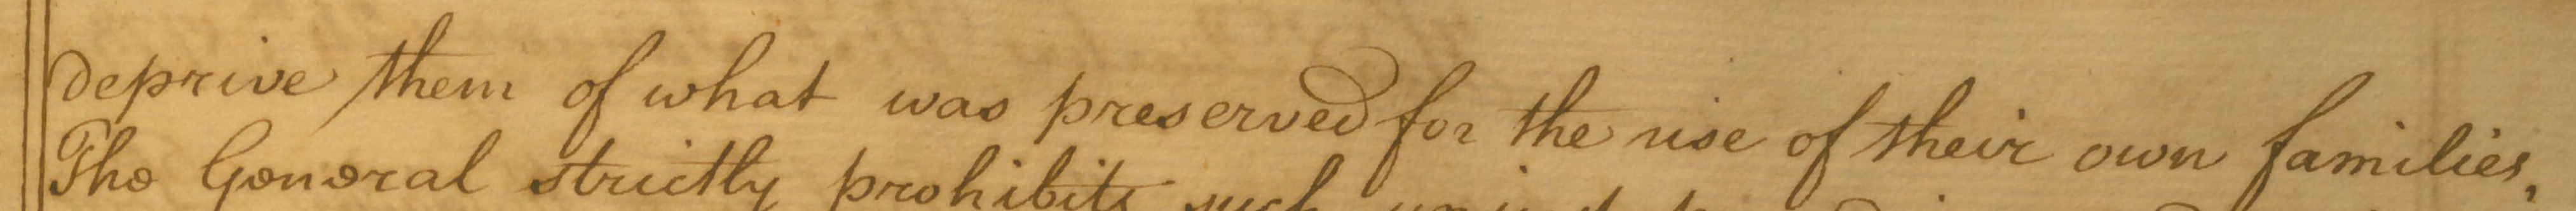deprive them of what was preserved for the rise of their own families,
